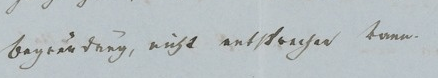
Begründung, nicht entsprechen kann.
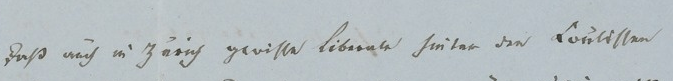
Daß auch in Zürich gewisse Liberale hinter den Coulissen
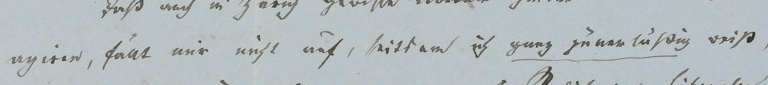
agiren, fällt mir nicht auf, seitdem ich ganz zuverläßig weiß,
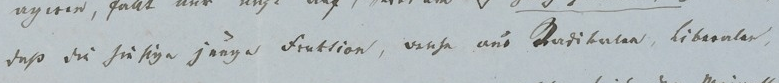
daß die hiesige junge Fraktion, welche aus Radikalen, Liberalen,
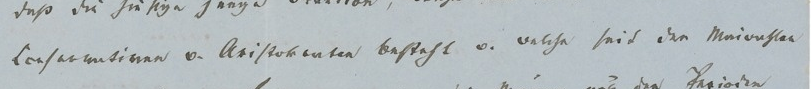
Conservativen u. Aristokraten besteht u. welche seit den Maiwahlen
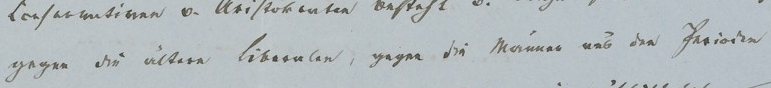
gegen die ältern Liberalen, gegen die Männer aus den Perioden
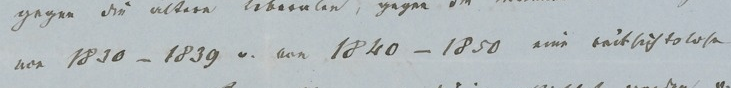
von 1830–1839 u. von 1840–1850 eine rücksichtslose
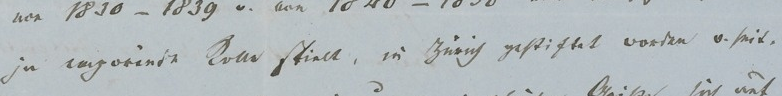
ja empörende Rolle spielt, in Zürich gestiftet worden u. seit-
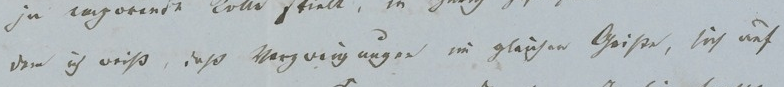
dem ich weiß, daß Verzweigungen im gleichen Geiste, sich auf
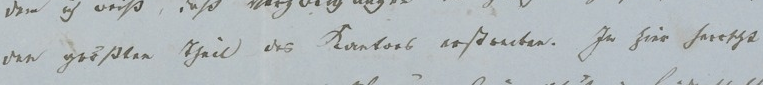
den größten Theil des Kantons erstrecken. In hier herrscht
